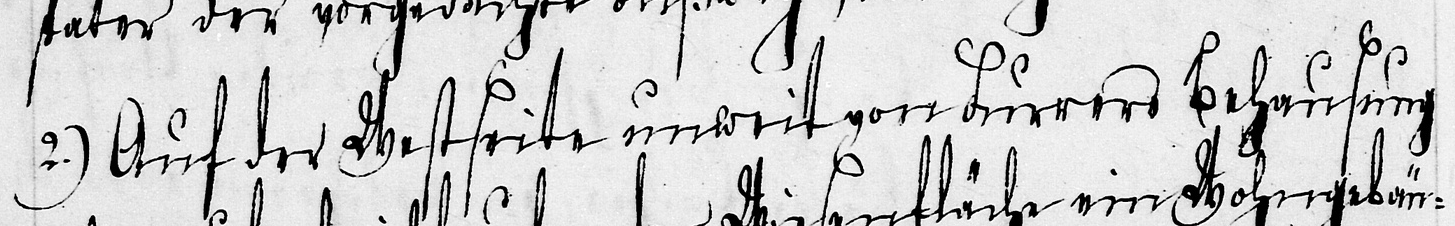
2.) Auf der Westseite unweit von Furrers Behausung
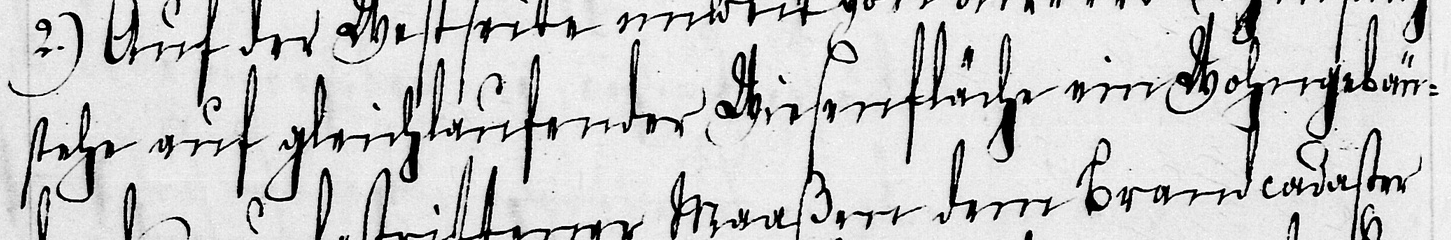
stehe auf gleichlaufender Wiesenfläche ein Wohngebäu¬
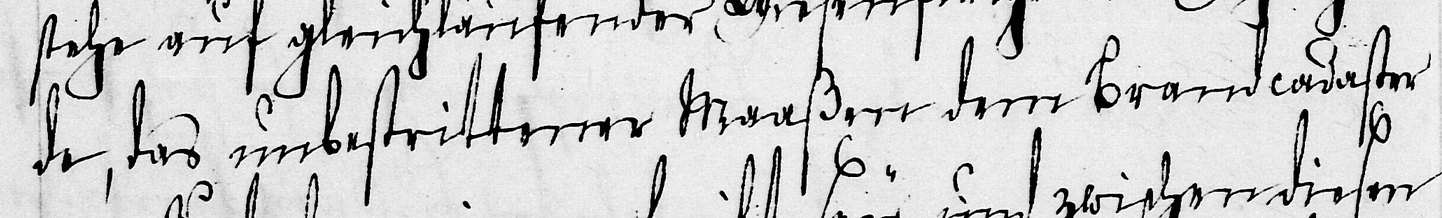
de, das unbestrittener Maaßen dem Brandcadaster
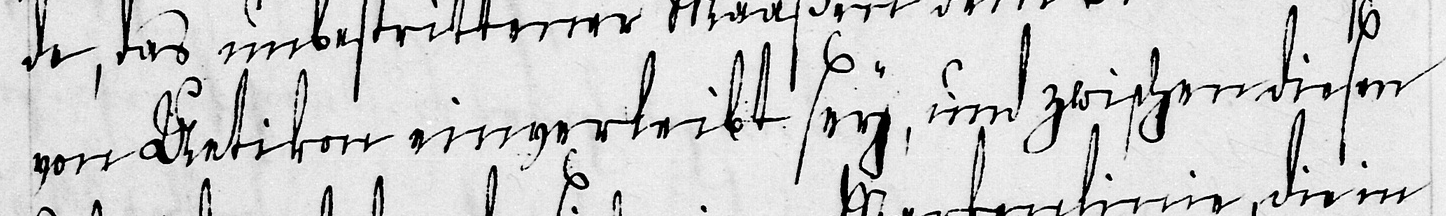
von Uetikon einverleibt sey, und zwischen diesen
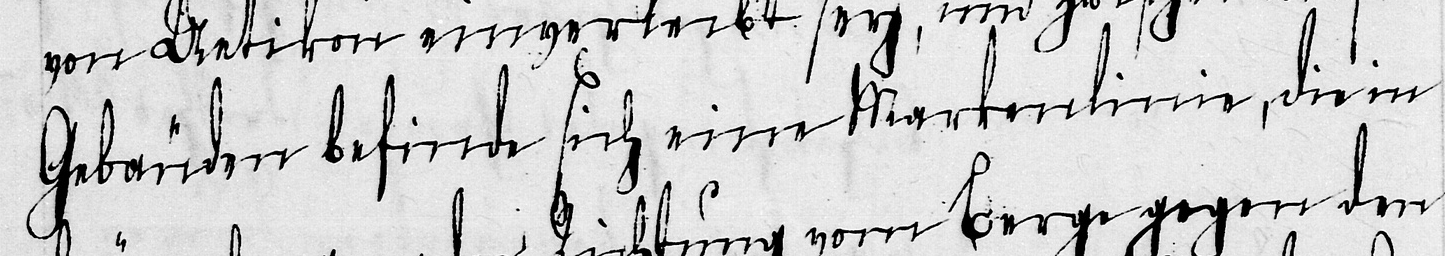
Gebäuden befinde sich eine Markenlinie, die in
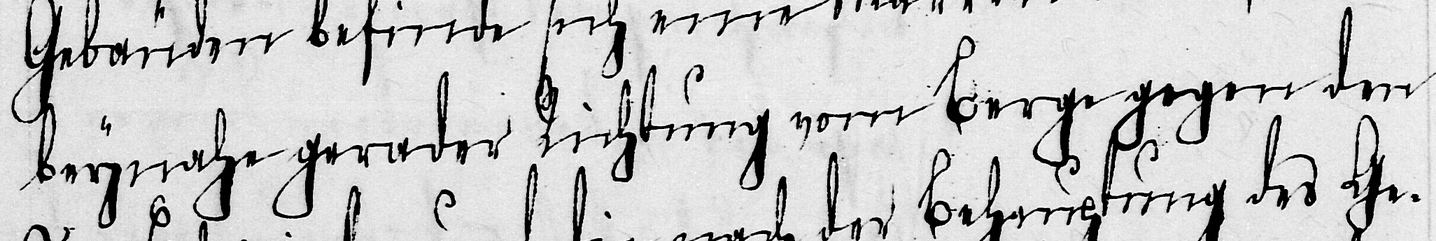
beynahe gerader Richtung vom Berge gegen den
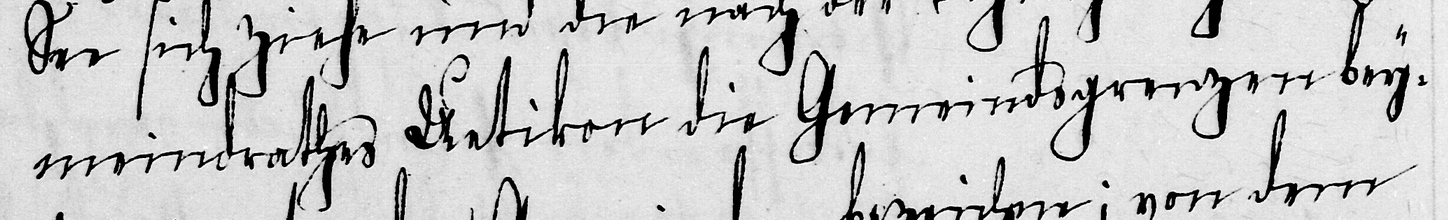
meindrathes Uetikon die Gemeindsgrenzen bey¬
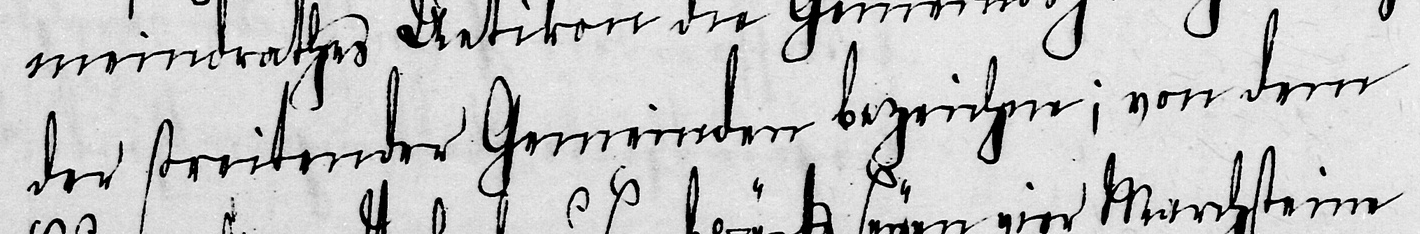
der streitender Gemeinden bezeichne; von dem
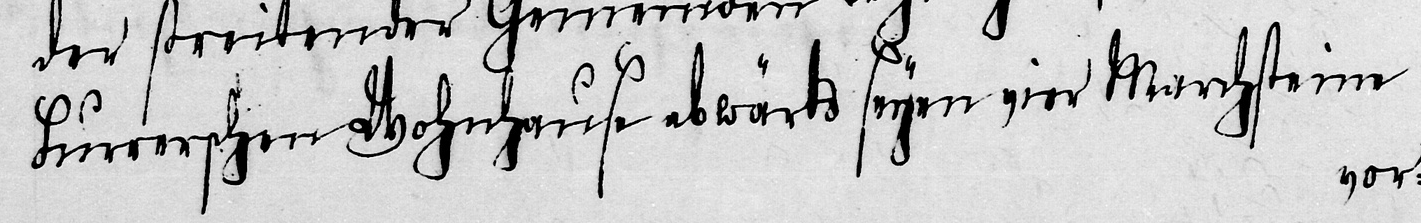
Furrerschen Wohnhause abwärts seyen vier Marchsteine
